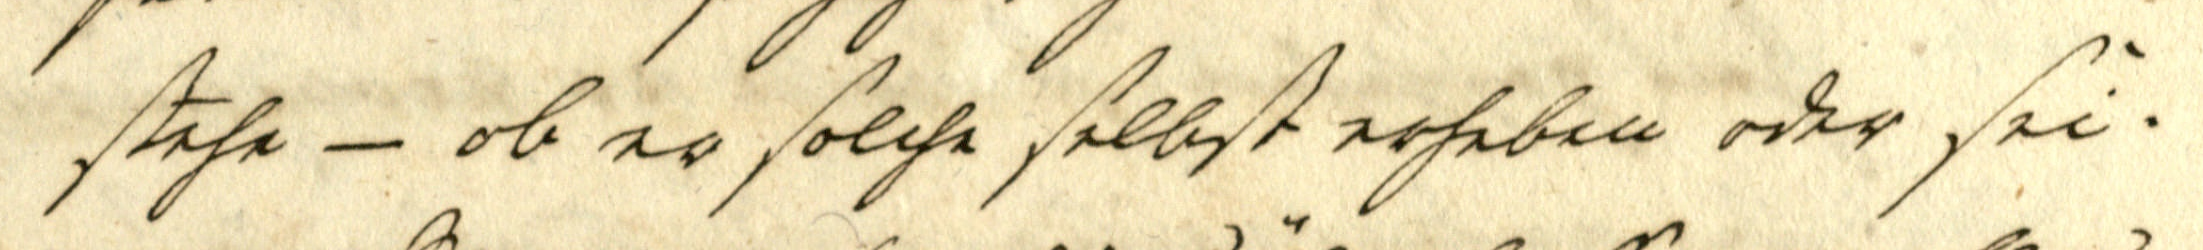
stehe - ob er solche selbst erheben der sei¬
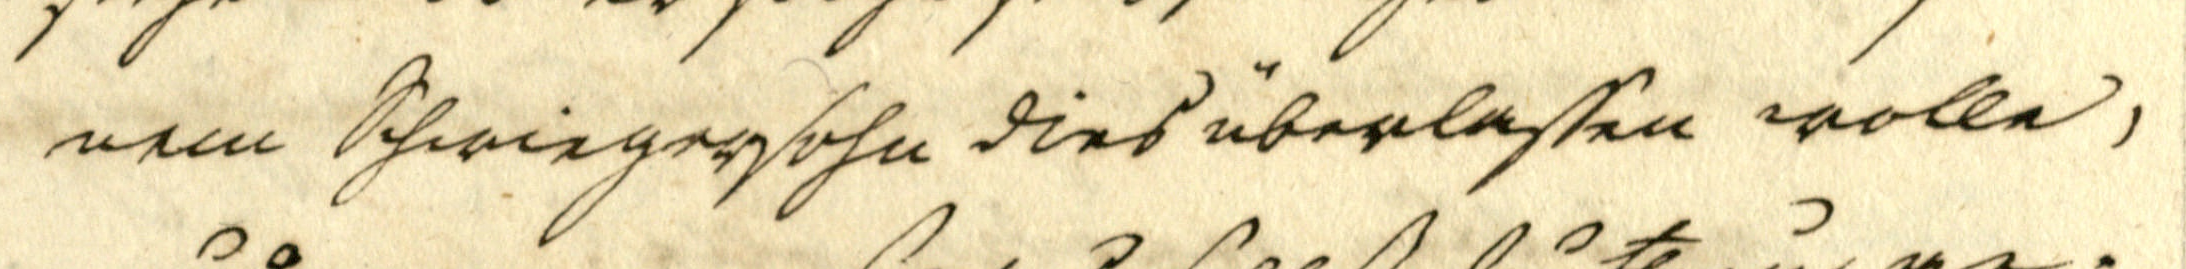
nem Schwiegersohn dies überlassen wolle,
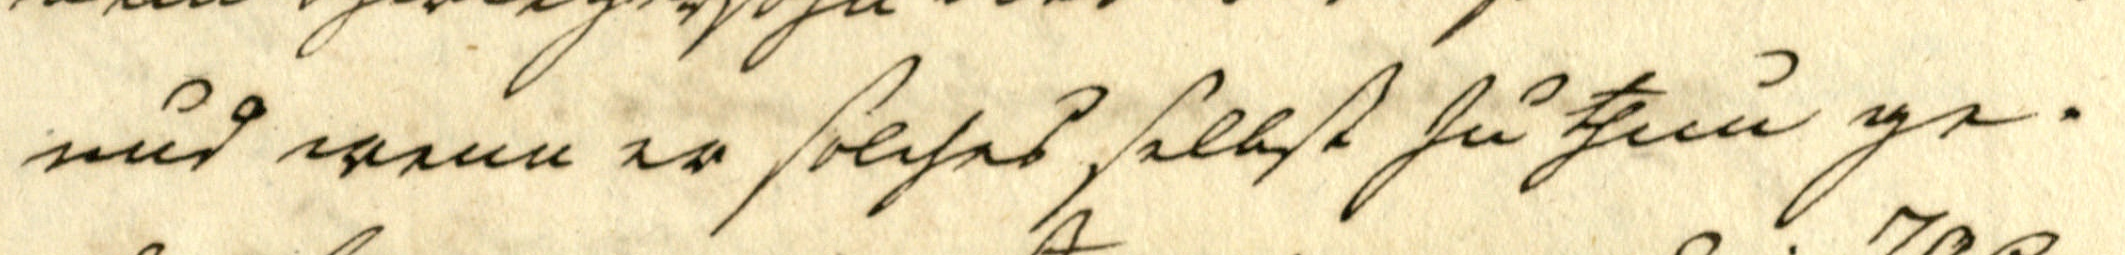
und wenn er solches selbst zu thun ge¬
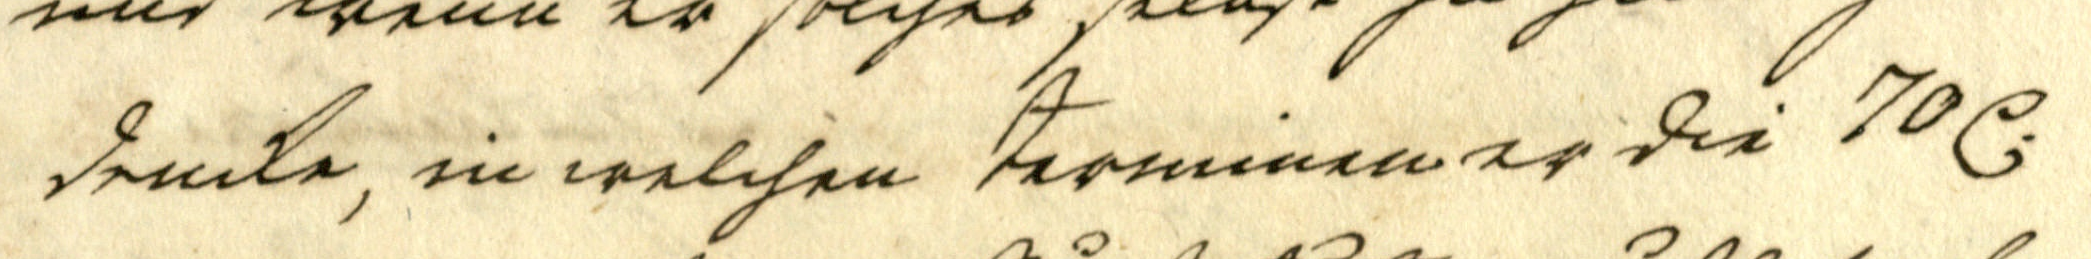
dencke, in welchen Terminen er die 70 l.
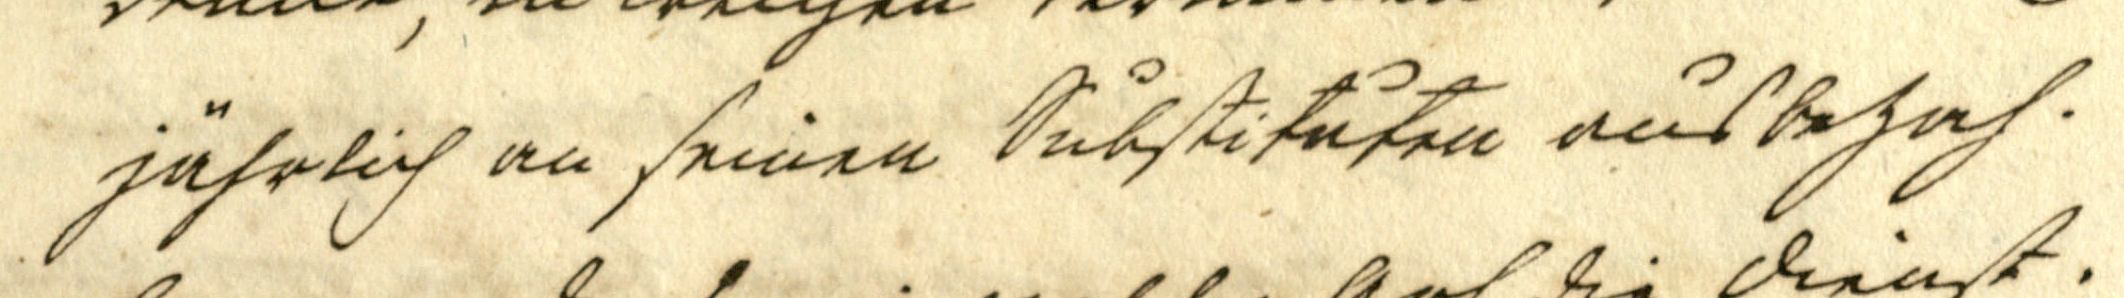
jährlich an seinen Substituten ausbezah-
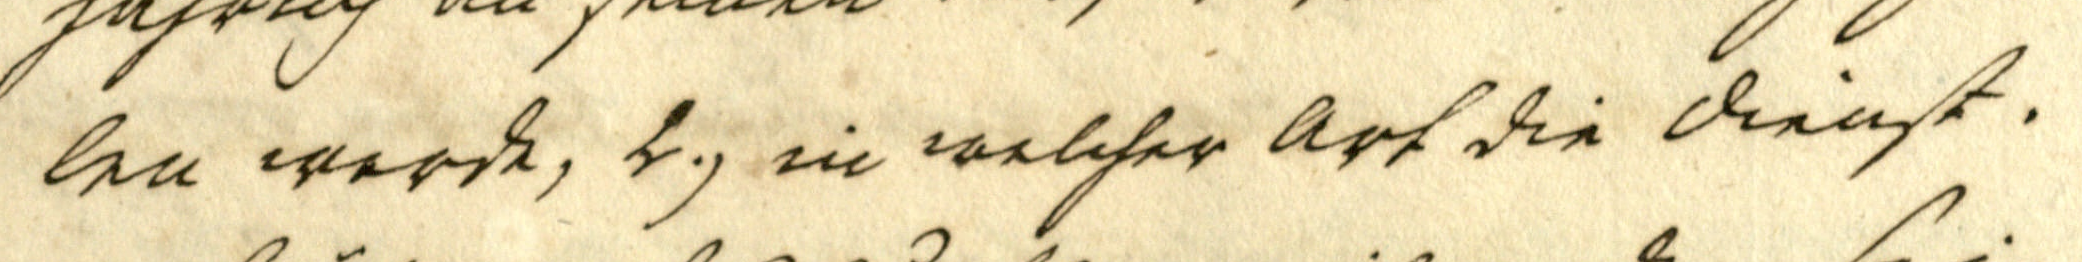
len werde, 2., in welcher Art die Dienst¬
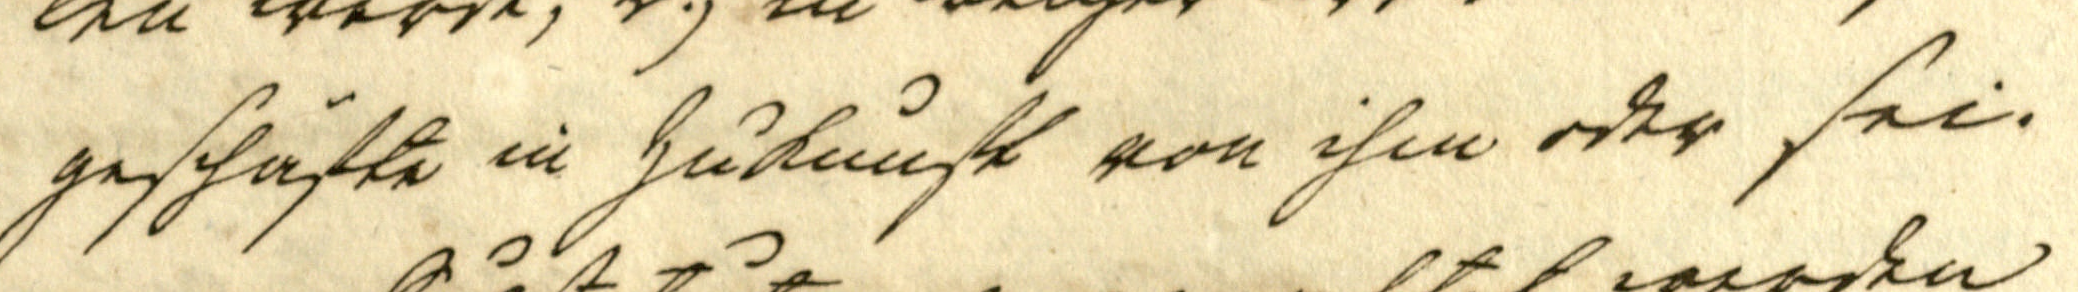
geschäfte in Zukunft von ihm oder sei¬
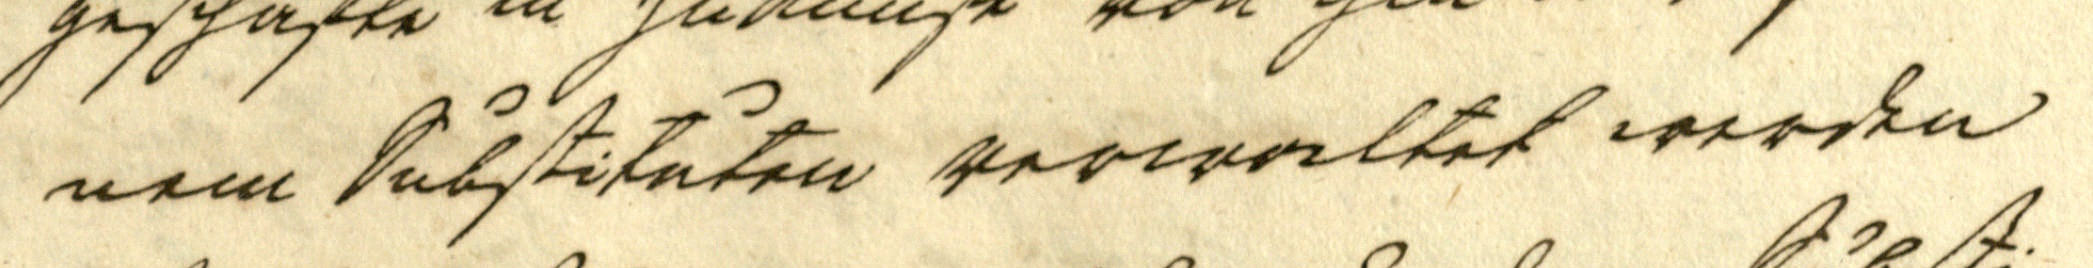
nem Substituten verwaltet werden
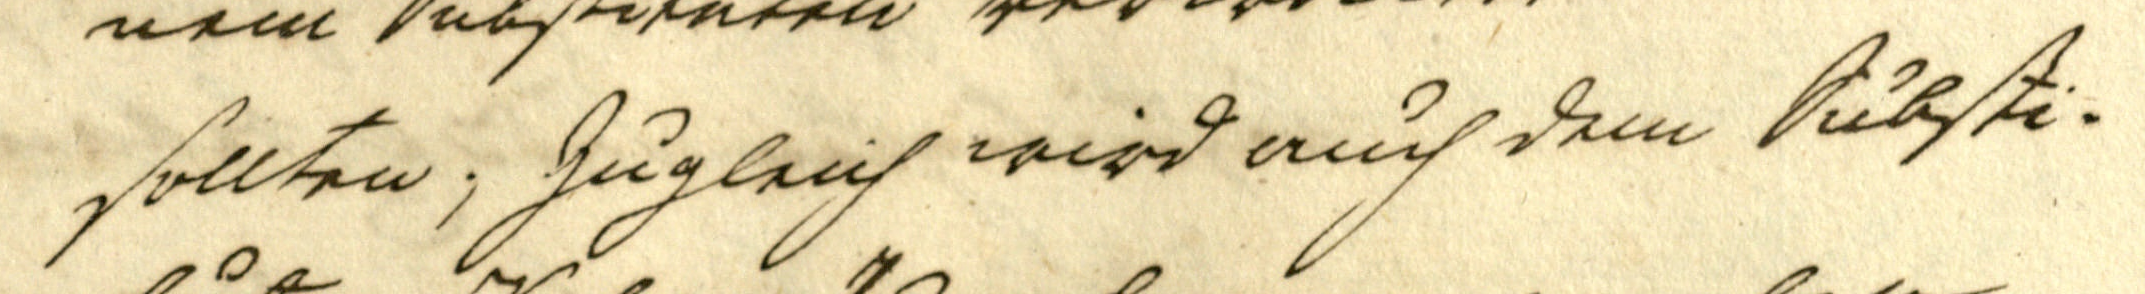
sollten, zugleich wird auch dem Substi¬
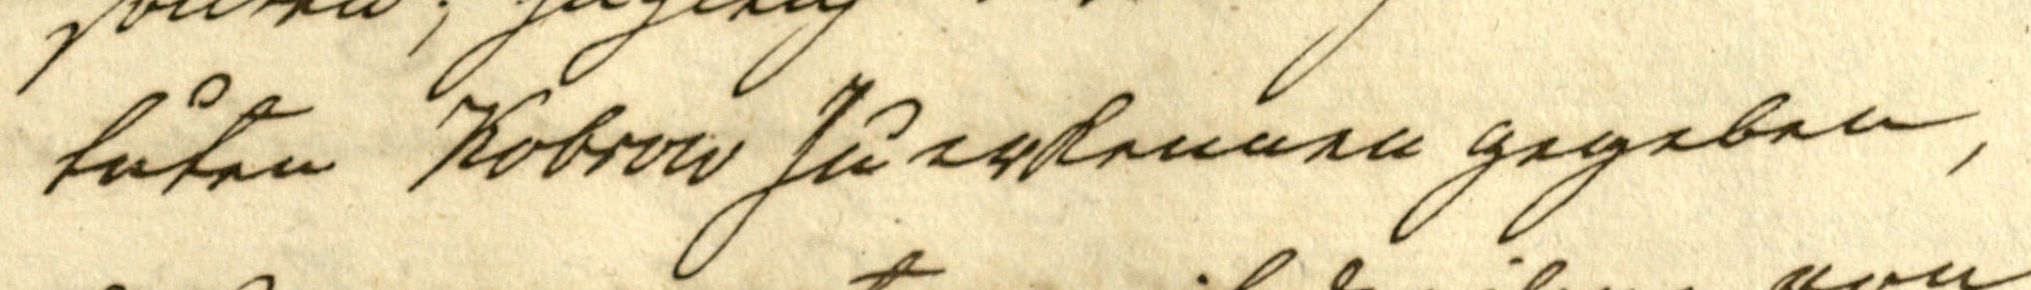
tuten Kobrow zu erkennen gegeben,
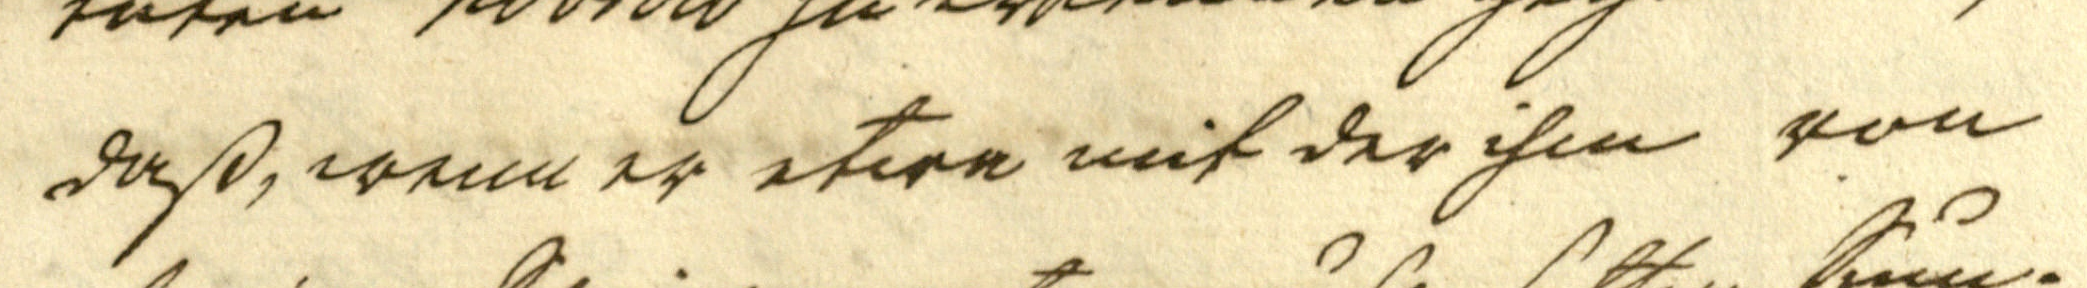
daß, wenn er etwa mit der ihm von
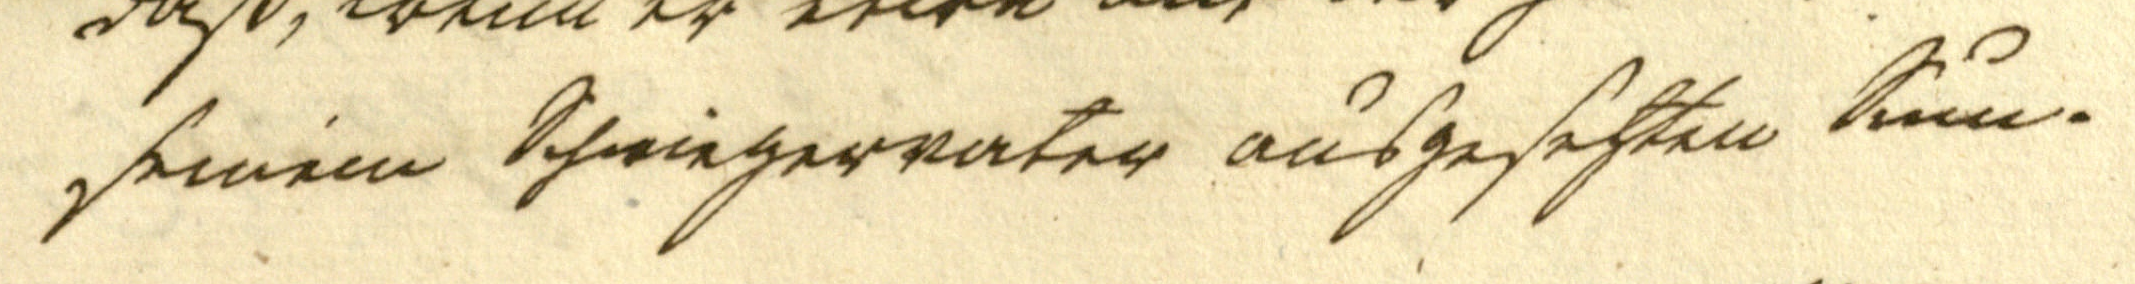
seinem Schiegervater ausgesetzten Sum¬
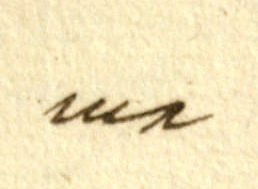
me
